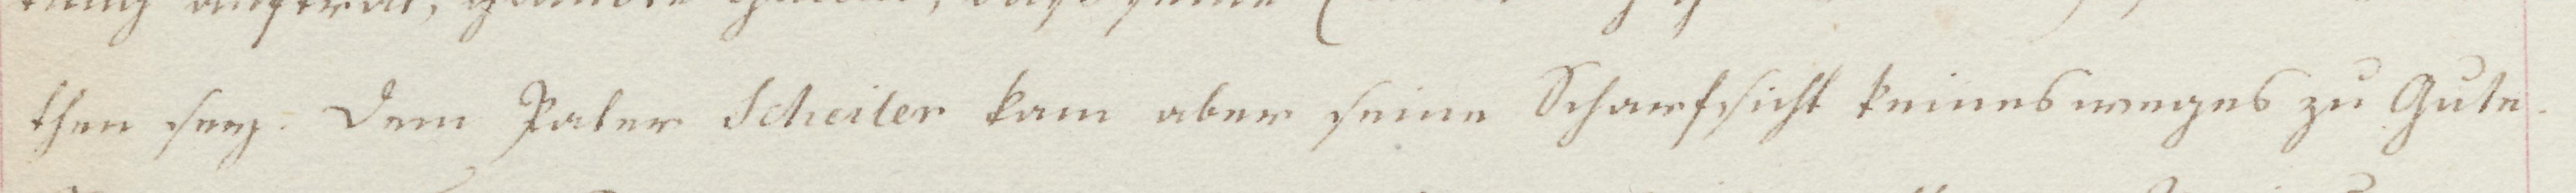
then sey. Dem Pater Scheiler kam aber seine Scharfsicht keinesweges zu Gute.
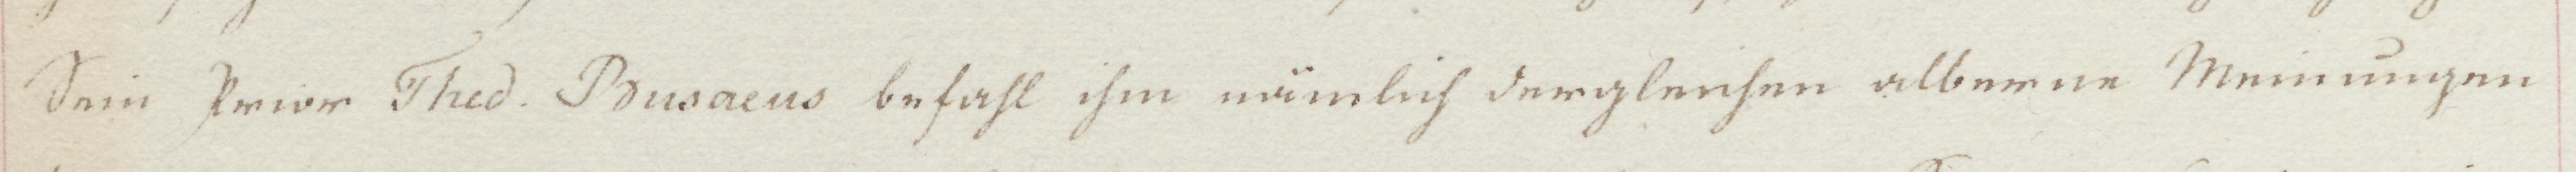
Sein Prior Thed. Busaeus befahl ihm nämlich dergleichen alberne Meinungen
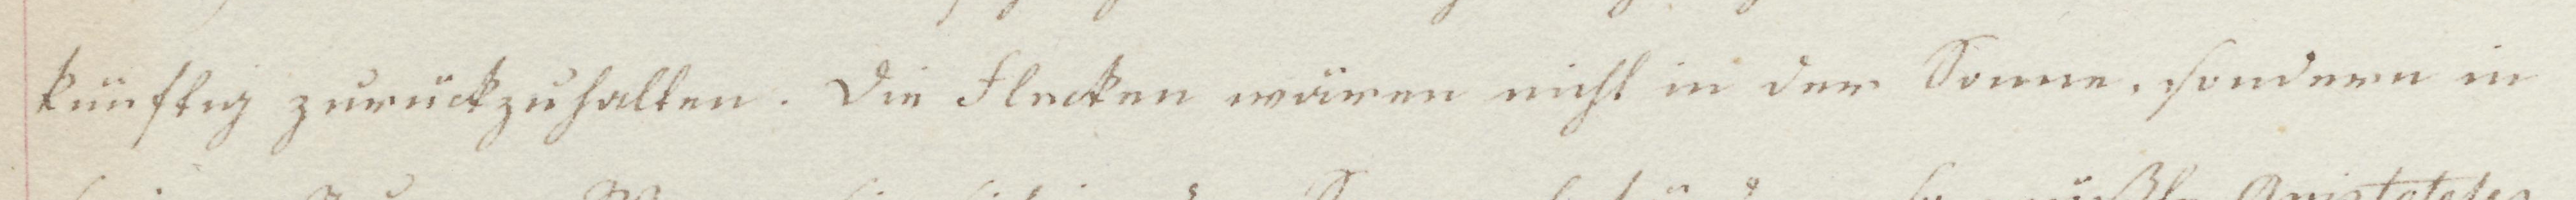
künftig zurückzuhalten. Die Flecken wären nicht in der Sonne, sondern in
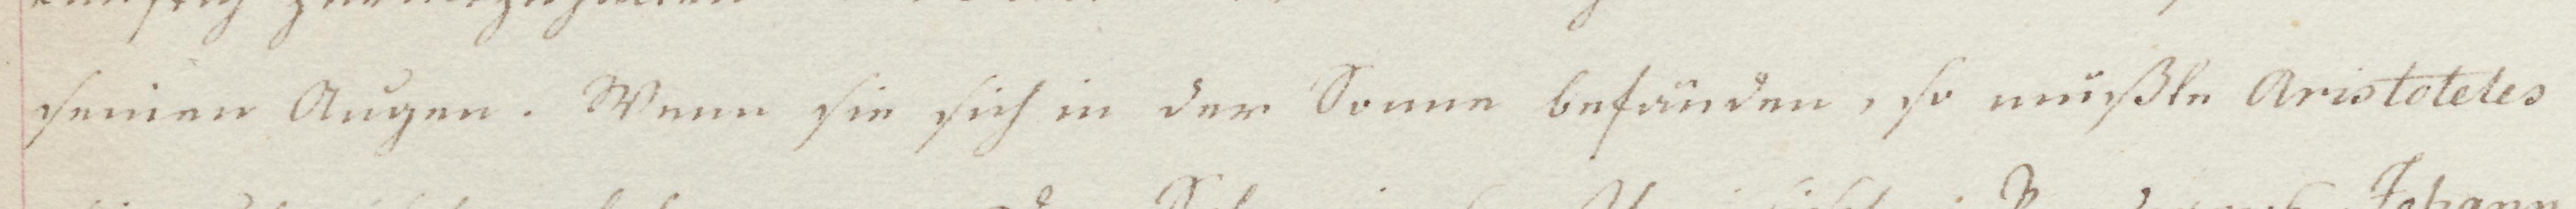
seinen Augen. Wenn sie sich in der Sonne befänden, so müßte Aristoteles
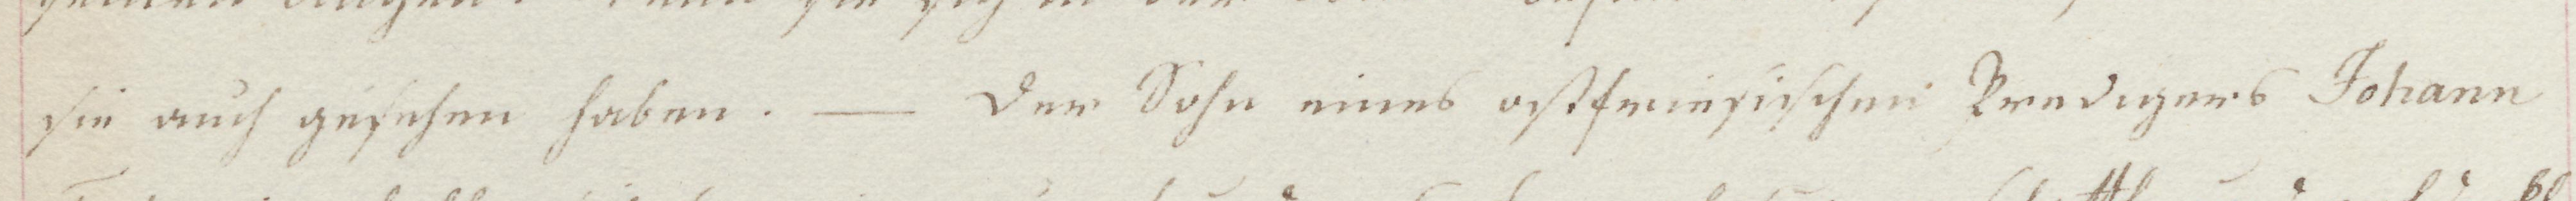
sie auch gesehen haben. – Der Sohn eines ostfriesischen Predigers Johann
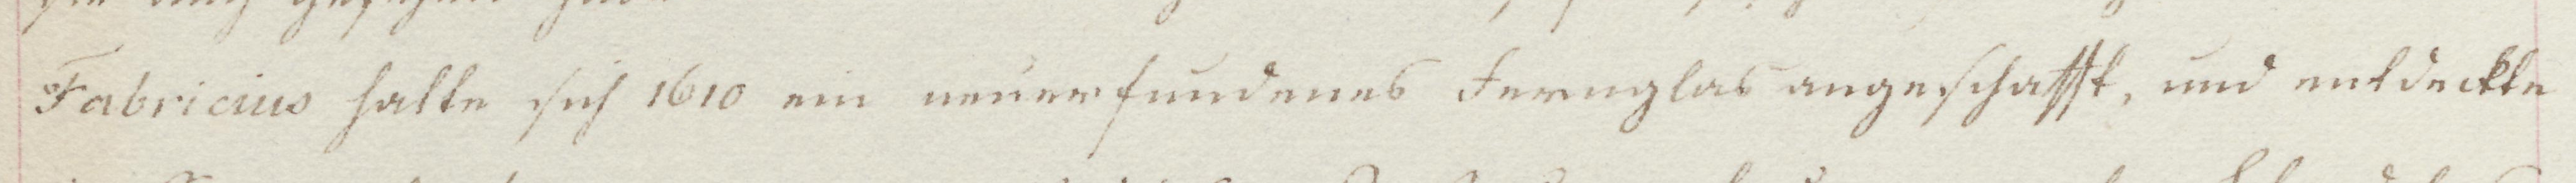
Fabricius hatte sich 1610 ein neuerfundenes Fernglas angeschafft, und entdeckte
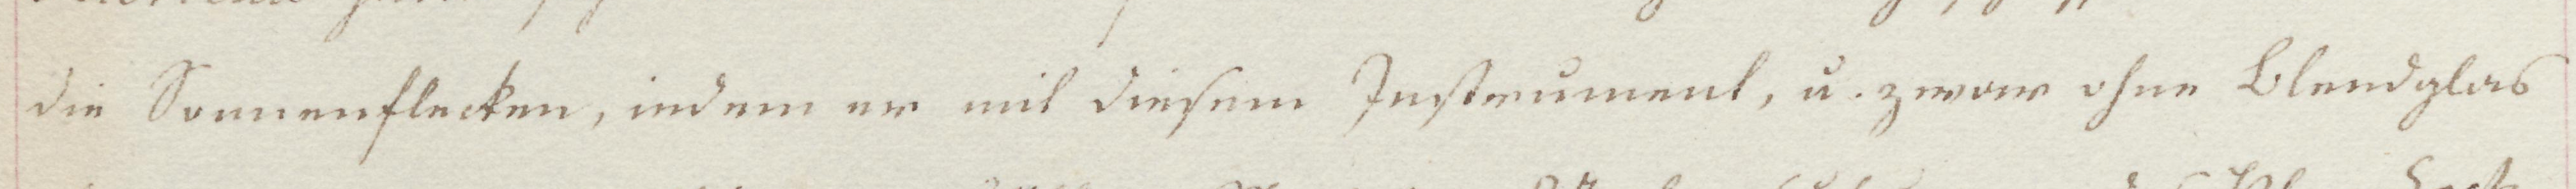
die Sonnenflecken, indem er mit diesem Instrument, u. zwar ohne Blendglas
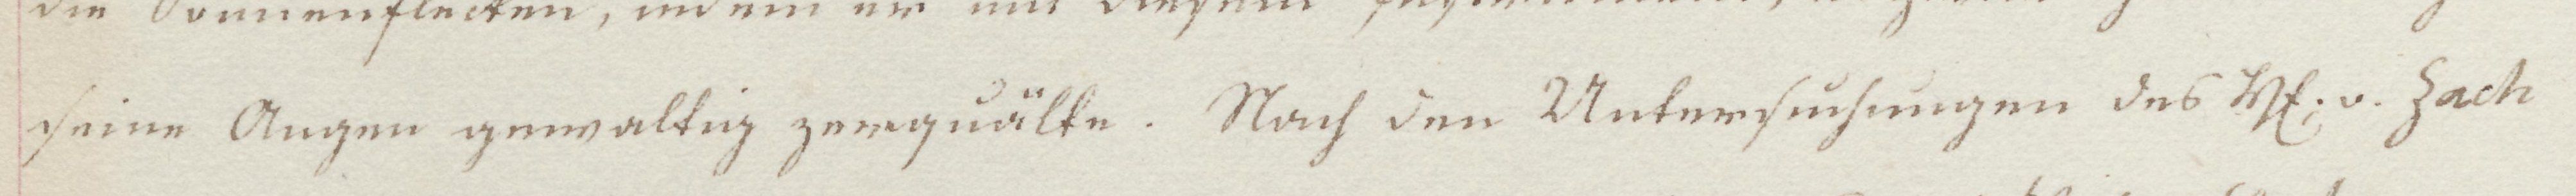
seine Augen gewaltig zerquälte. Nach den Untersuchungen des H￼. v. Zach
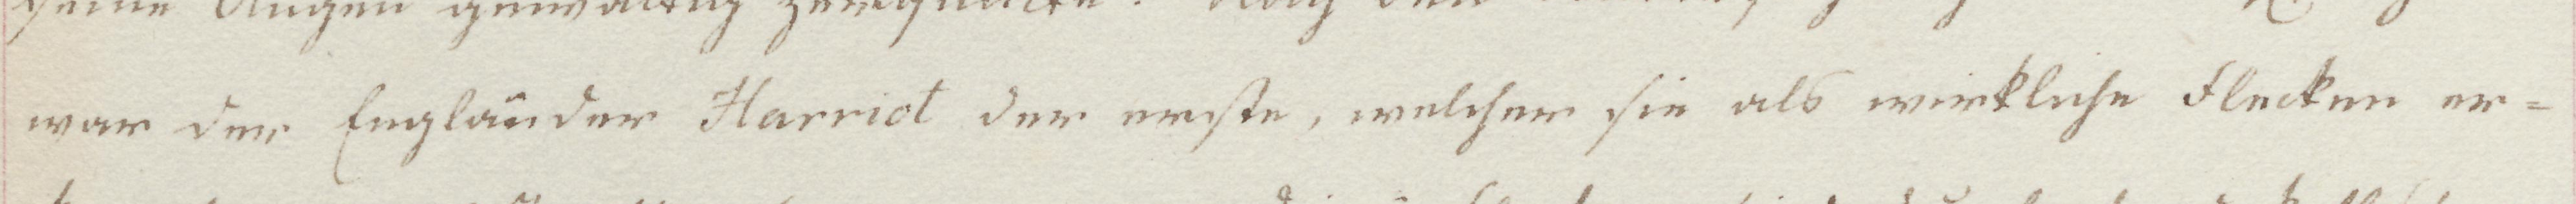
war der Engländer Harriot der erste, welcher sie als wirkliche Flecken er-
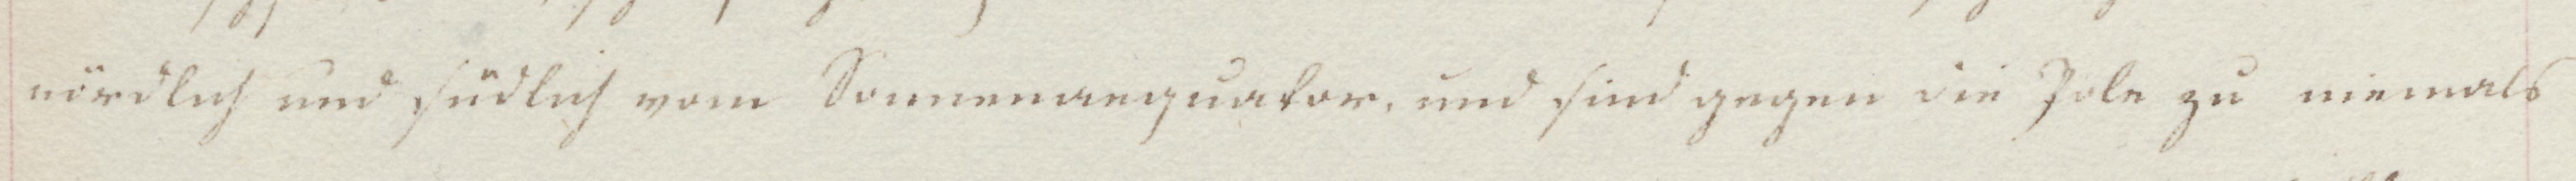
nördlich und südlich vom Sonnenäquator, und sind gegen die Pole zu niemals
